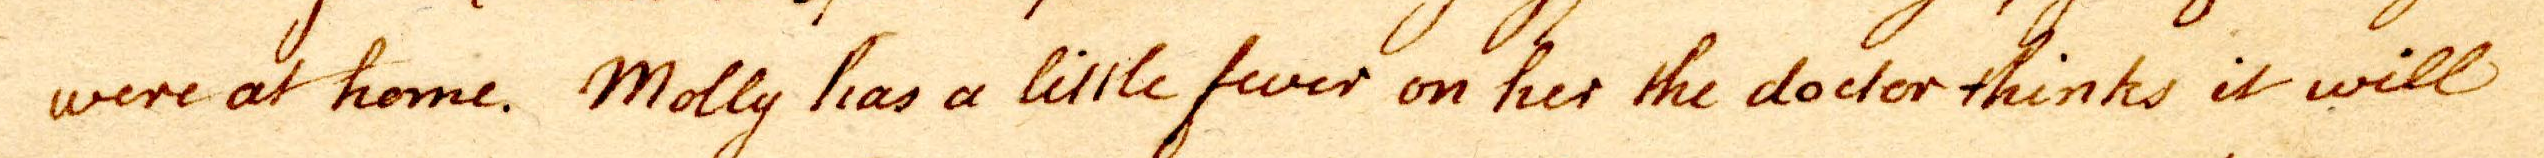were at home. Molly has a little fever on her the doctor thinks it will
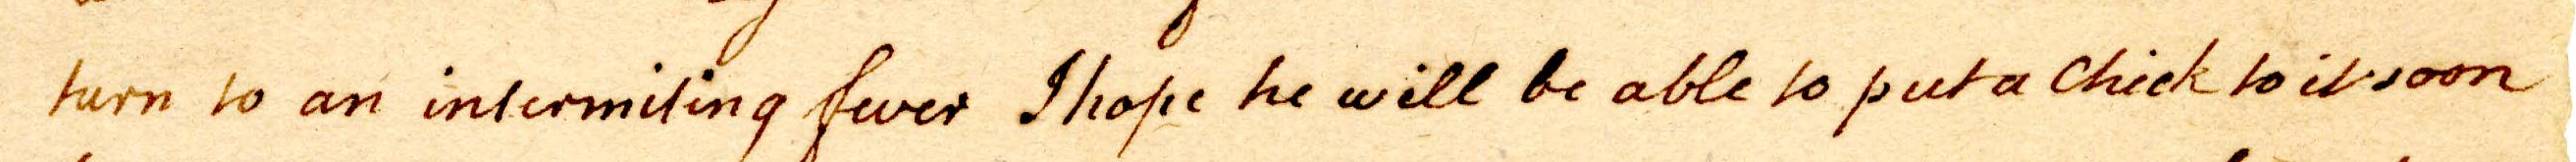turn to an intermiting fever I hope he will be able to put a Check to it soon
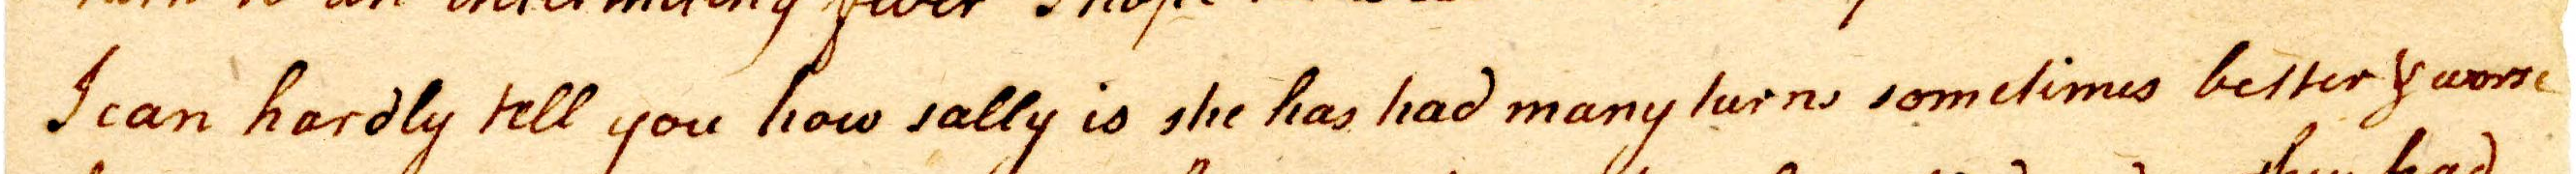I can hardly tell you how sally is she has had many turns sometimes better & worse
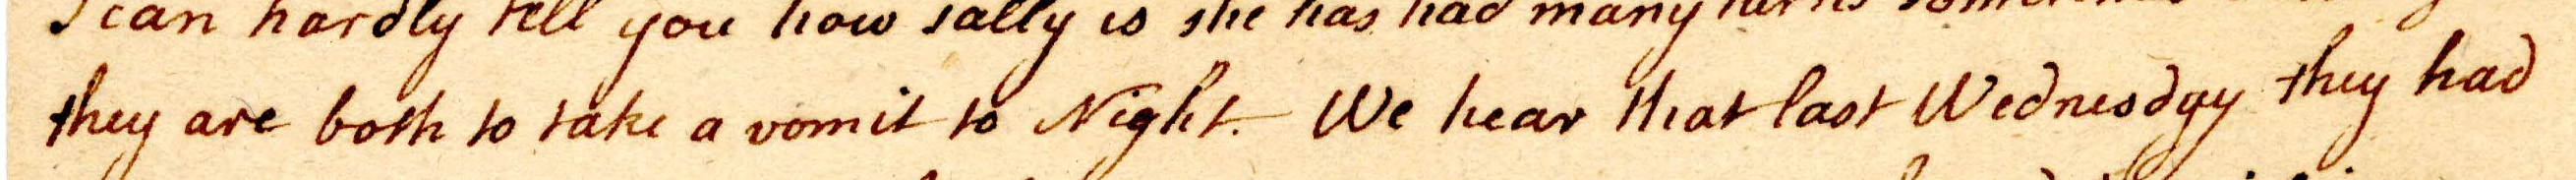they are both to take a vomit to Night. We hear that last Wednesday they had
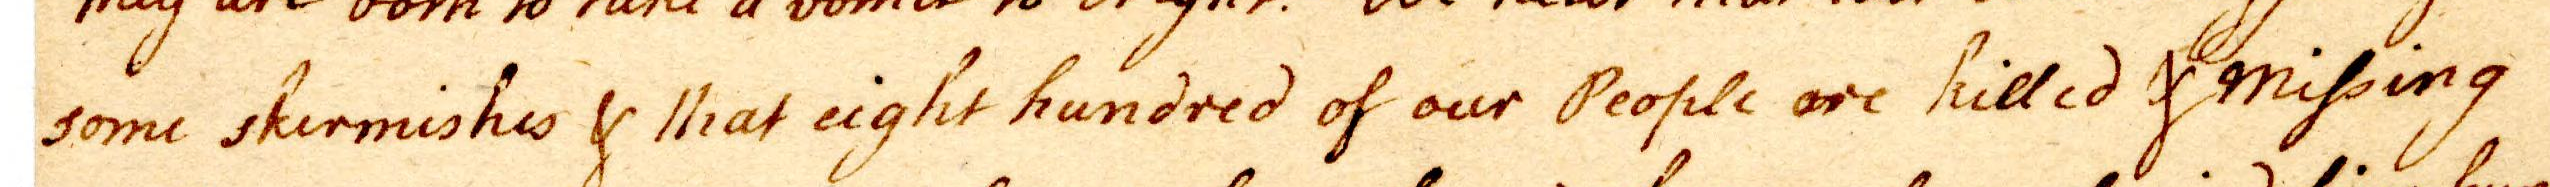some skirmishes & that eight hundred of our People are killed & missing
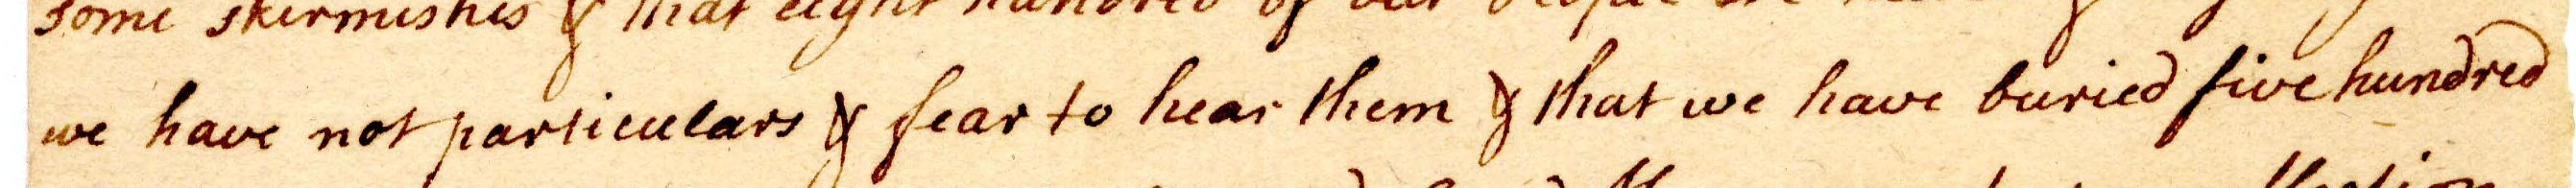we have not particulars & fear to hear them & that we have buried five hundred
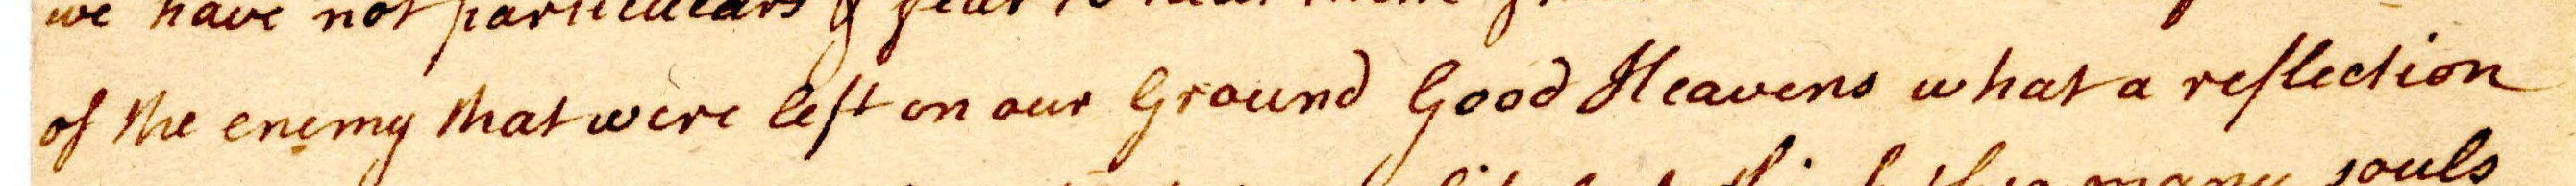of the enemy that were left on our Ground Good Heavens what a reflection
